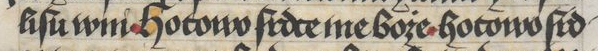liſu wni.Hotowo ſrdce me boże.hotowo ſrd¬
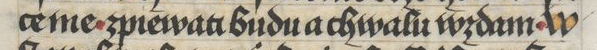ce me.zpiewati budu a chwalu wzdam.W¬
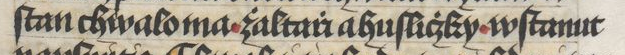ſtan chwalo ma.żaltaṙi a huſlicżky.wſtanut
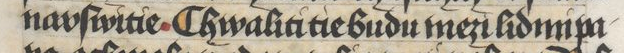navſwitie.Chwaliti tie budu mezi lidmi pa¬
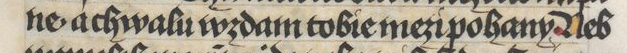ne.a chwalu wzdam tobie mezi pohany.Neb
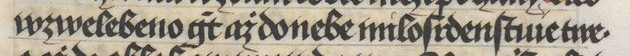wzwelebeno ḡt aż donebe miloſrdenſtuie twe.
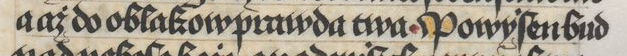a až do oblakow prawda twa.Powyẛen bud
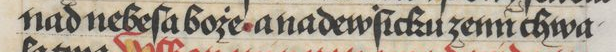nad nebeſa boże.a nadewẛicku zemi chwa¬
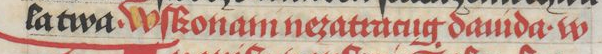la twa.Wſkonam nezatracug dauida.w
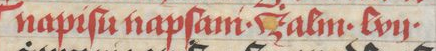napiſu napſaní.Żalm.lvij.
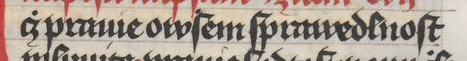cż prauie owẛem ſprawedlnoſt
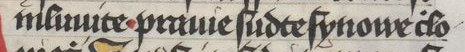mluuíte.prauie ſudte ſynowe ċlo¬
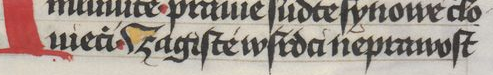uieċi.Zagiſté wſrdci neprawoſt
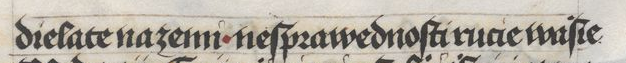dielate na zemi.neſprawednoſti rucie waẛie
